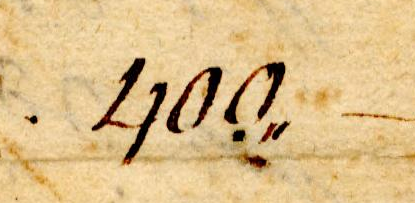400.
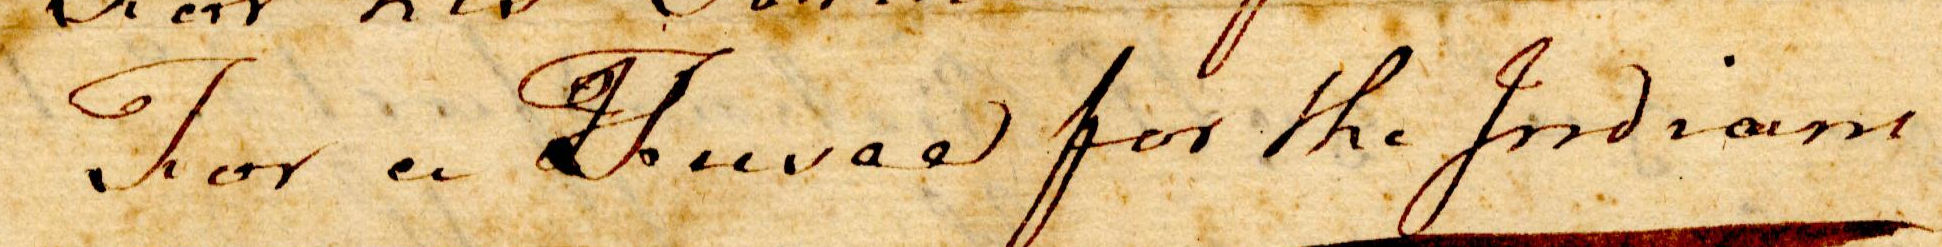For a Fuvae for the Indians
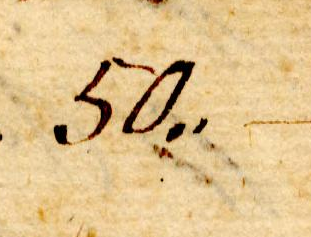50.
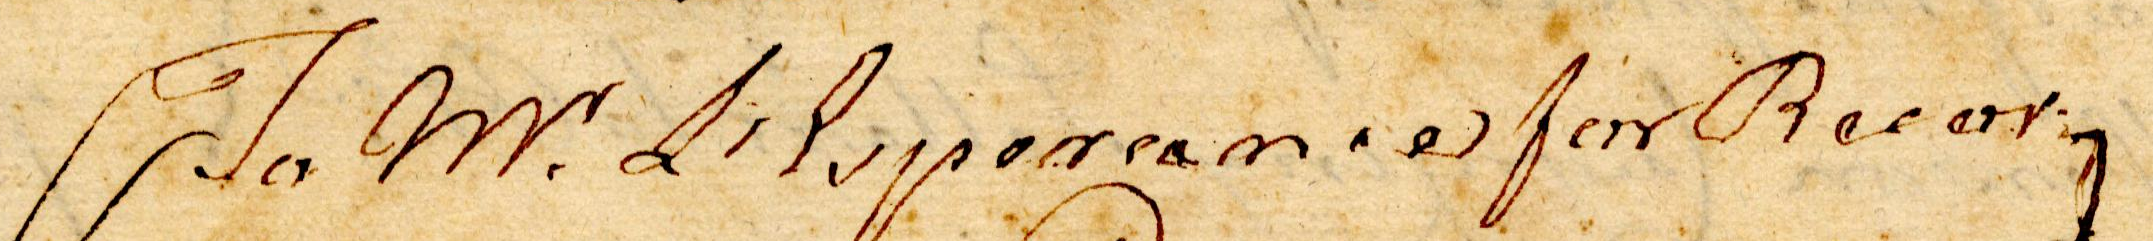To M^r L Suporeame for Recor-
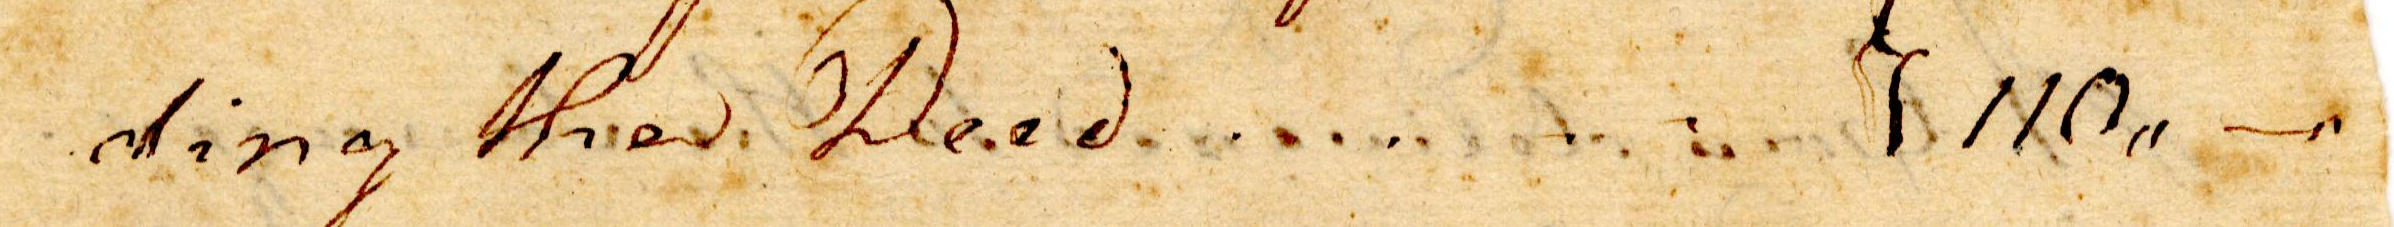-ding the Deed. ........£110.-
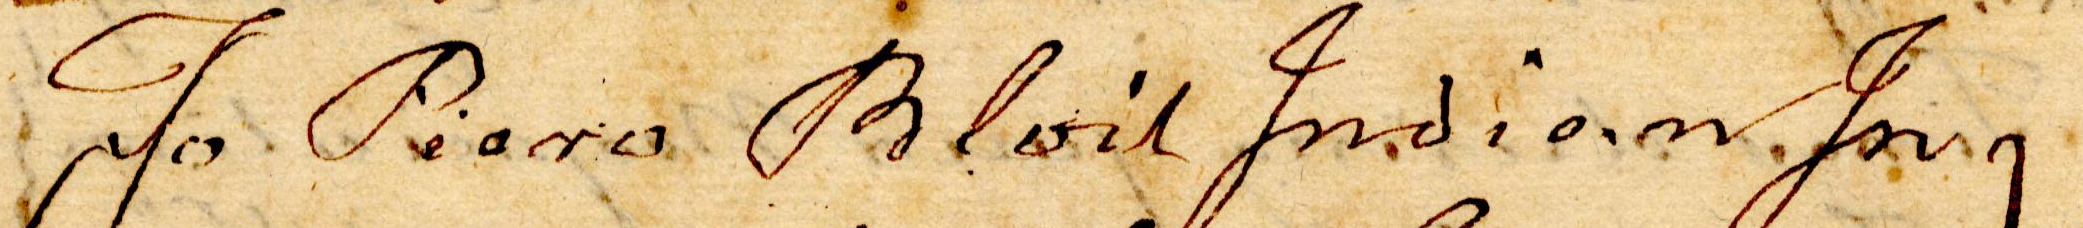To Pierre Bloil Indian for
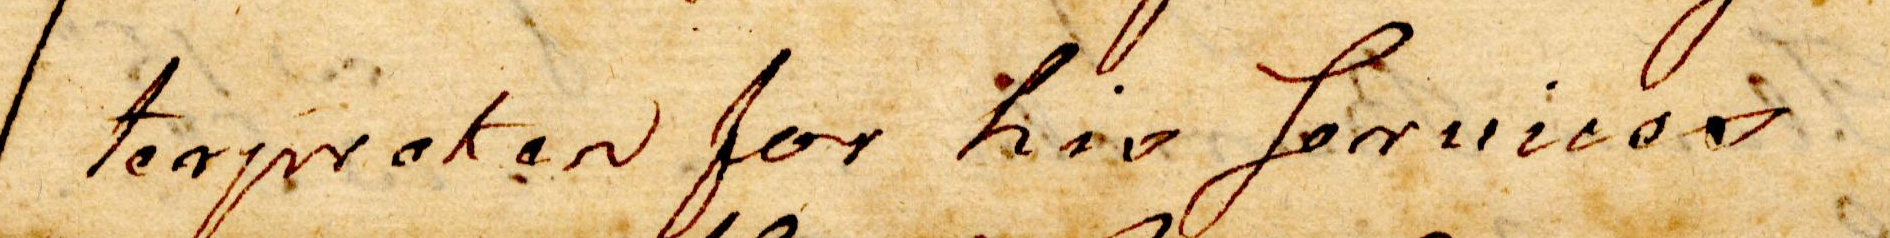terproken taken for his services
